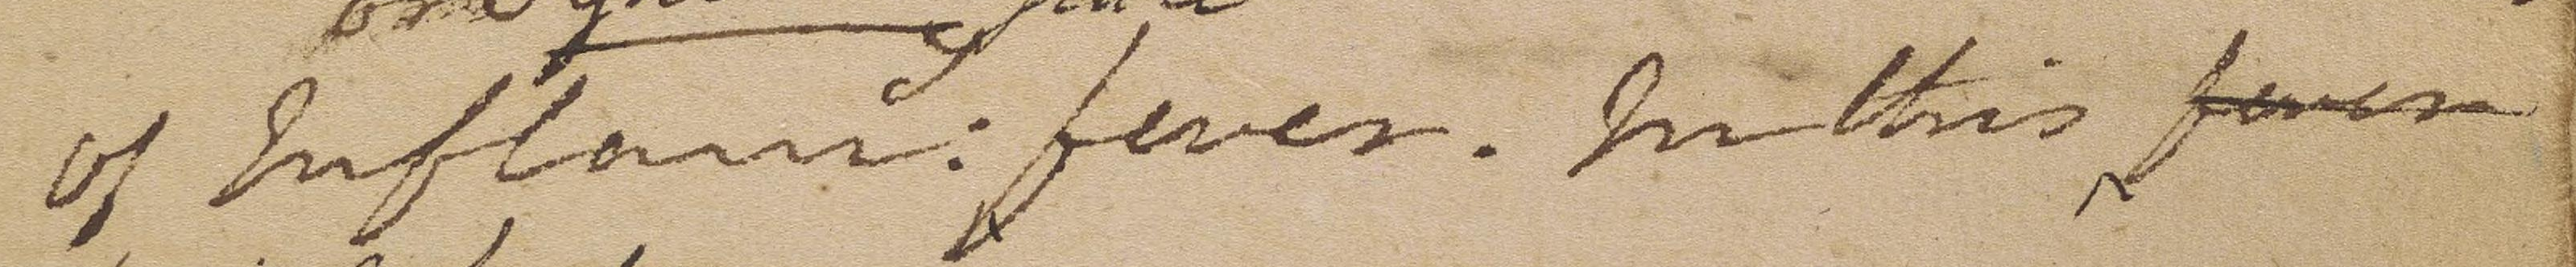of Inflam^y fever. In this ^ [fever]
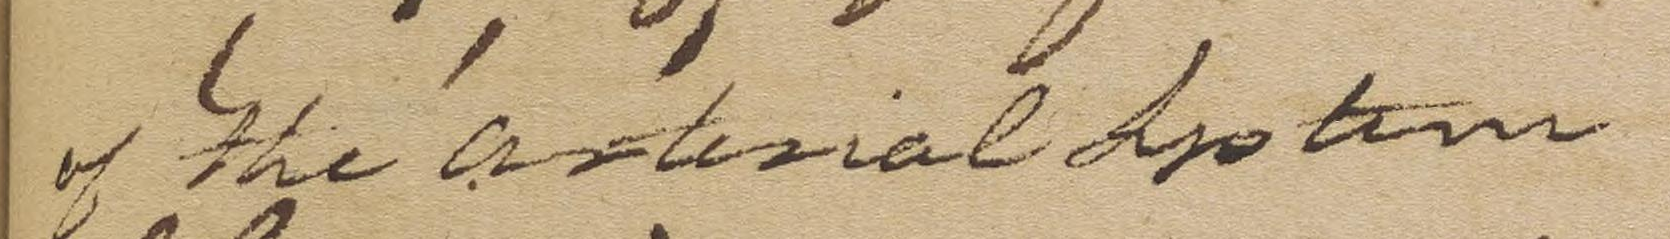of the arterial system
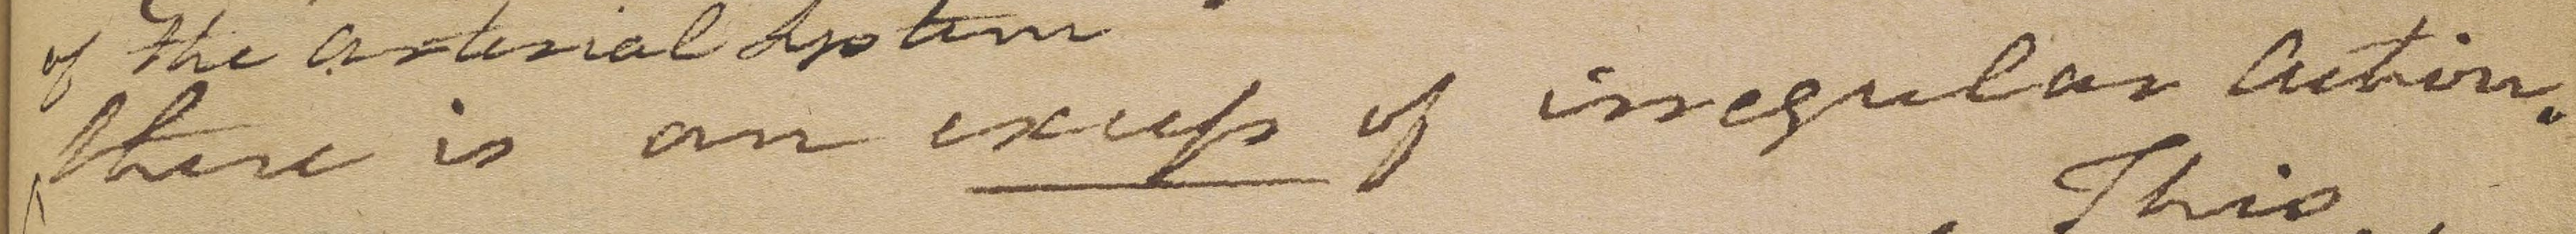^ there is an excess of irregular action.
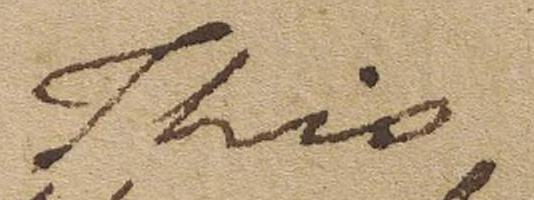This
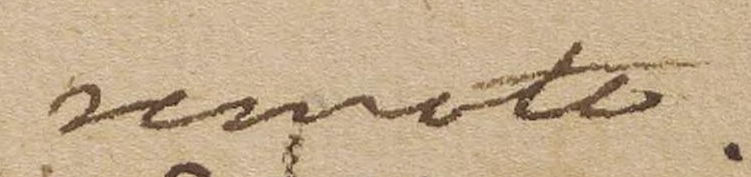remote
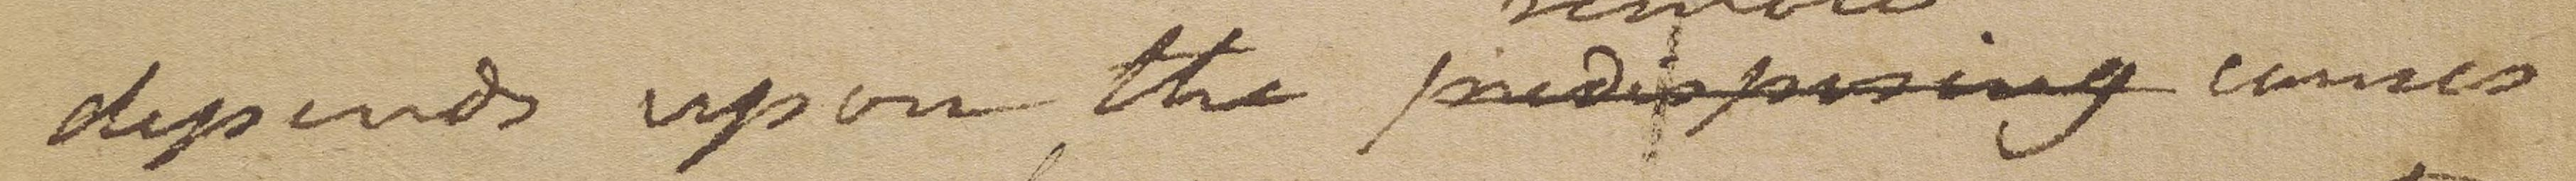depends upon the [predisposing] causes
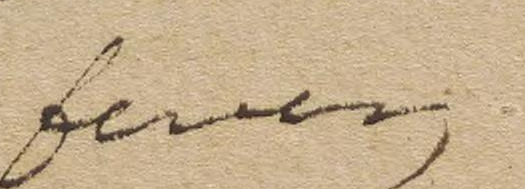fever
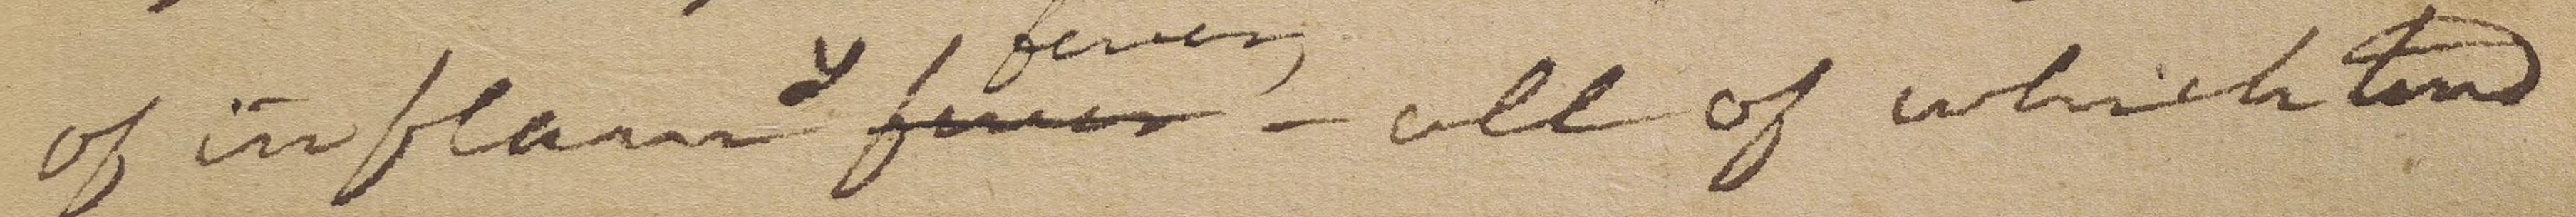of inflam^y [fever], all of which tend
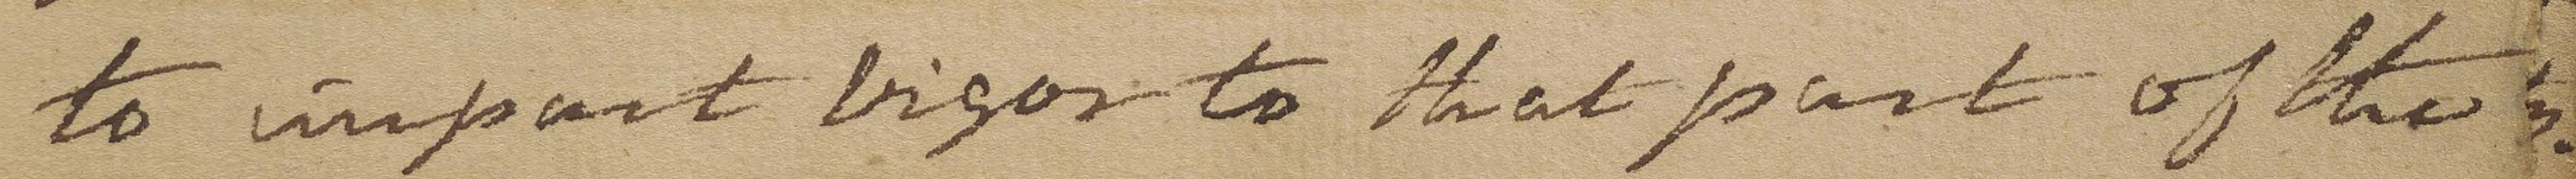to impart vigor to that part of the
